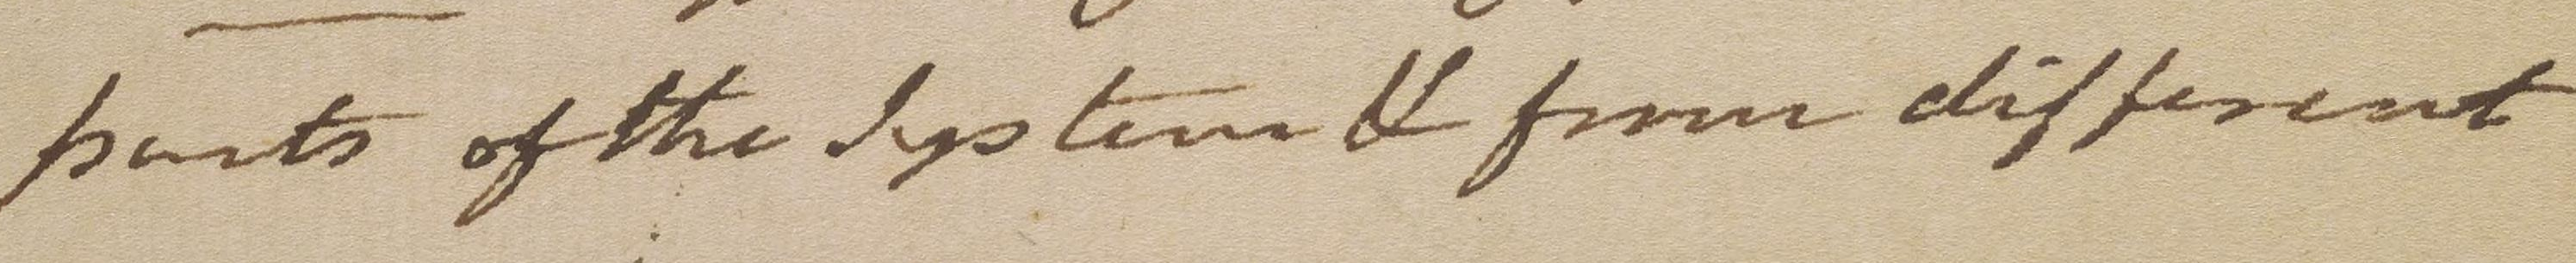parts of the system & from different
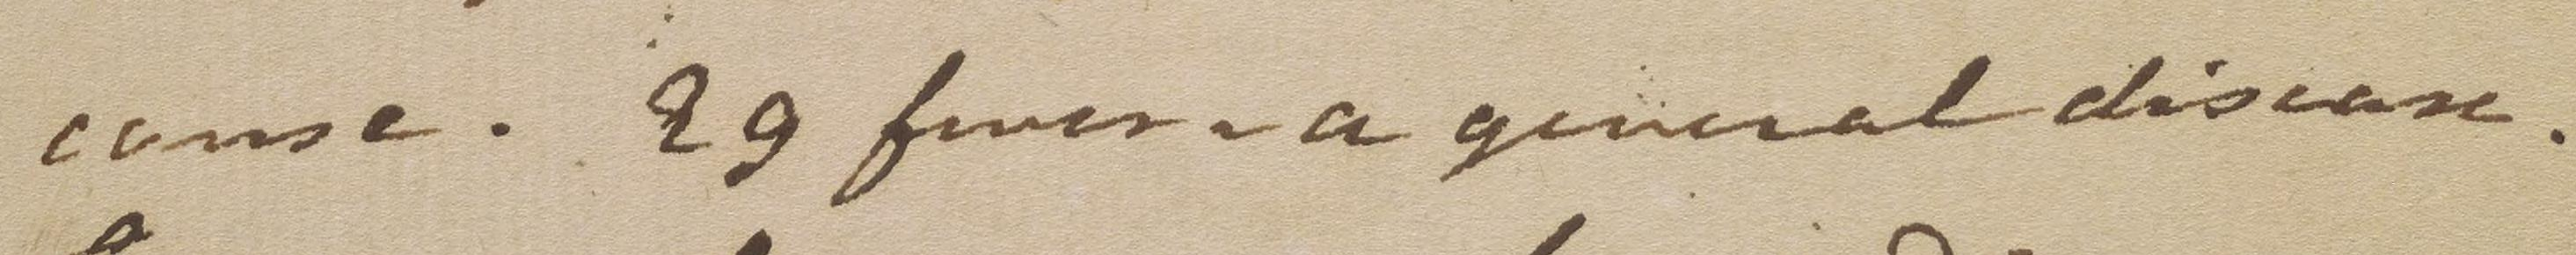cause. E.g. fever, a general disease
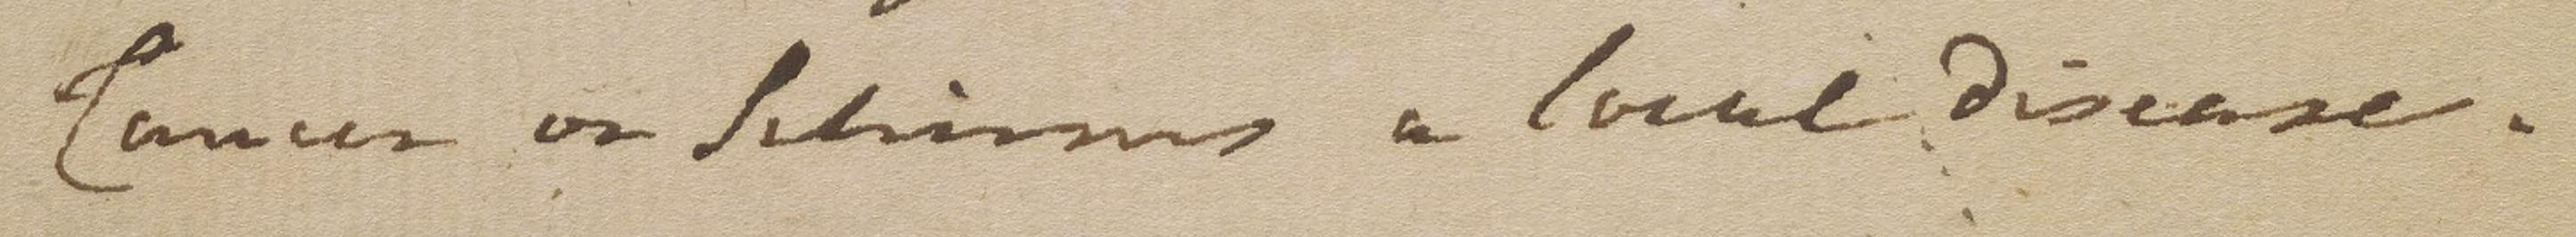Cancer or schisms a local disease.
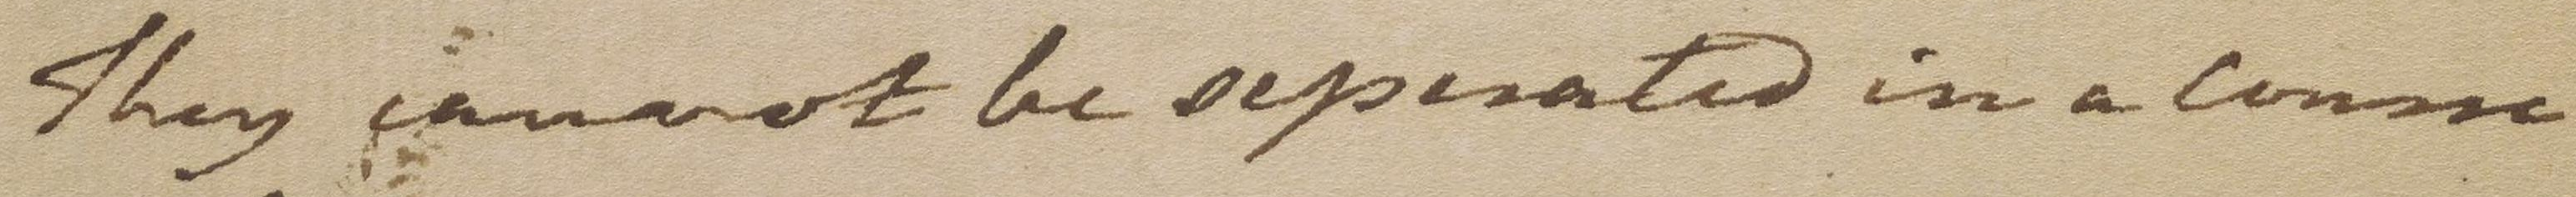They cannot be separated in a course
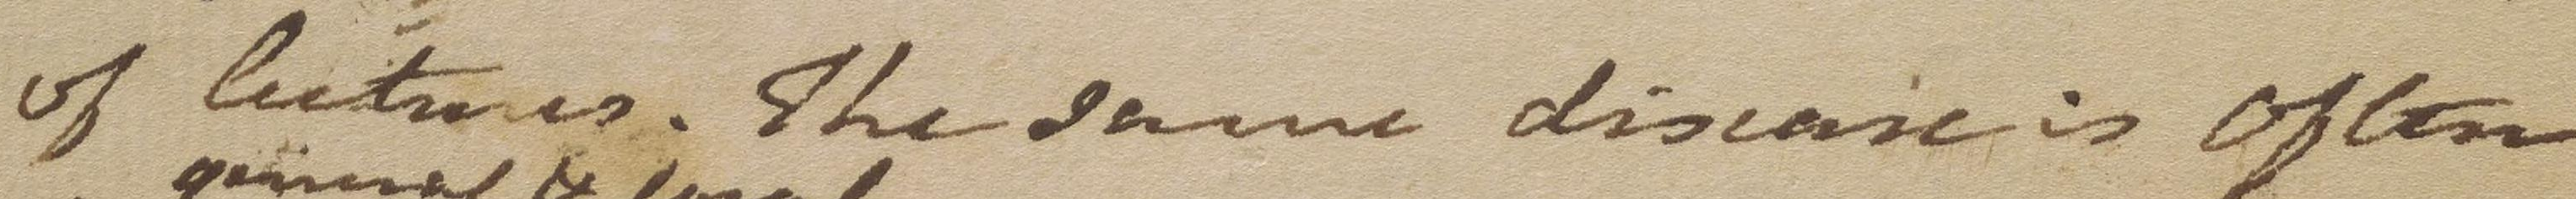of lectures. The same disease is often
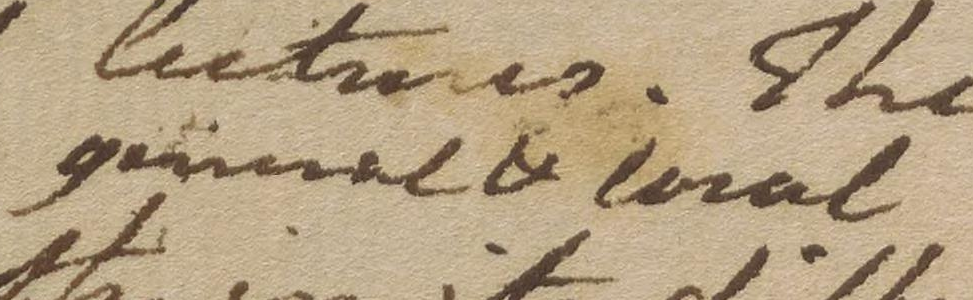general & local
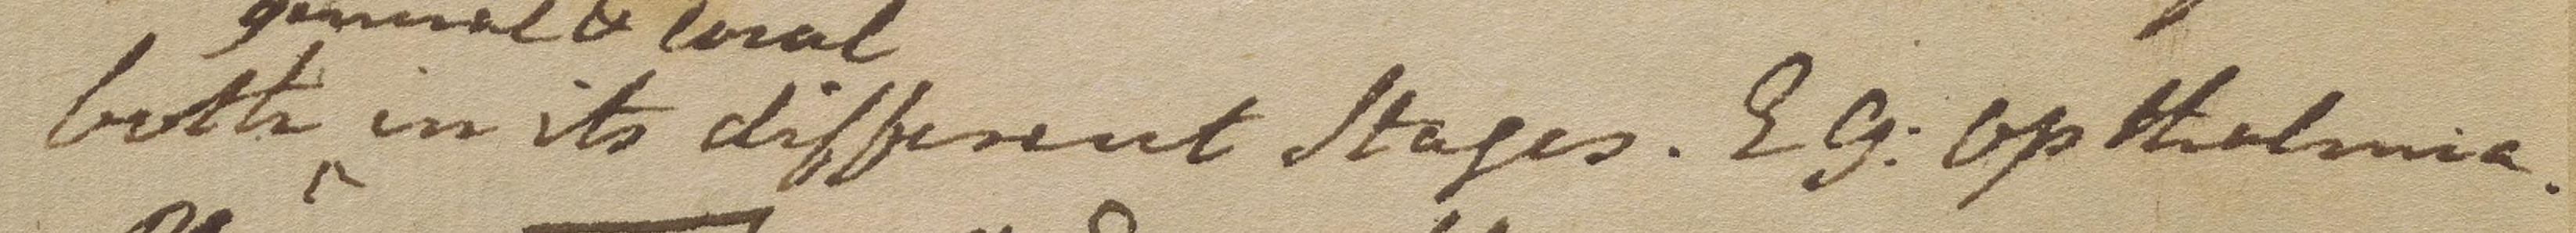both ^ in its different stages. E.g. opthalmia
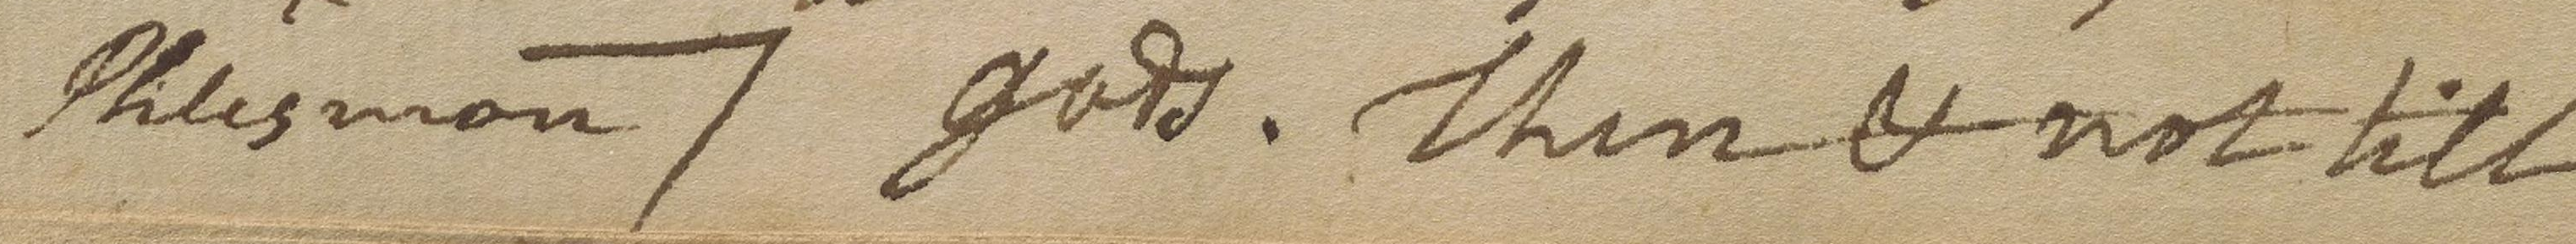Phligman gots. then & not till
